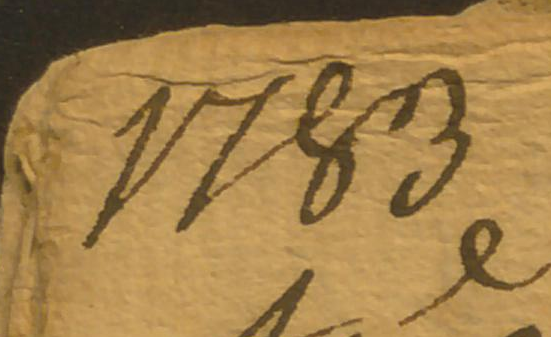1783
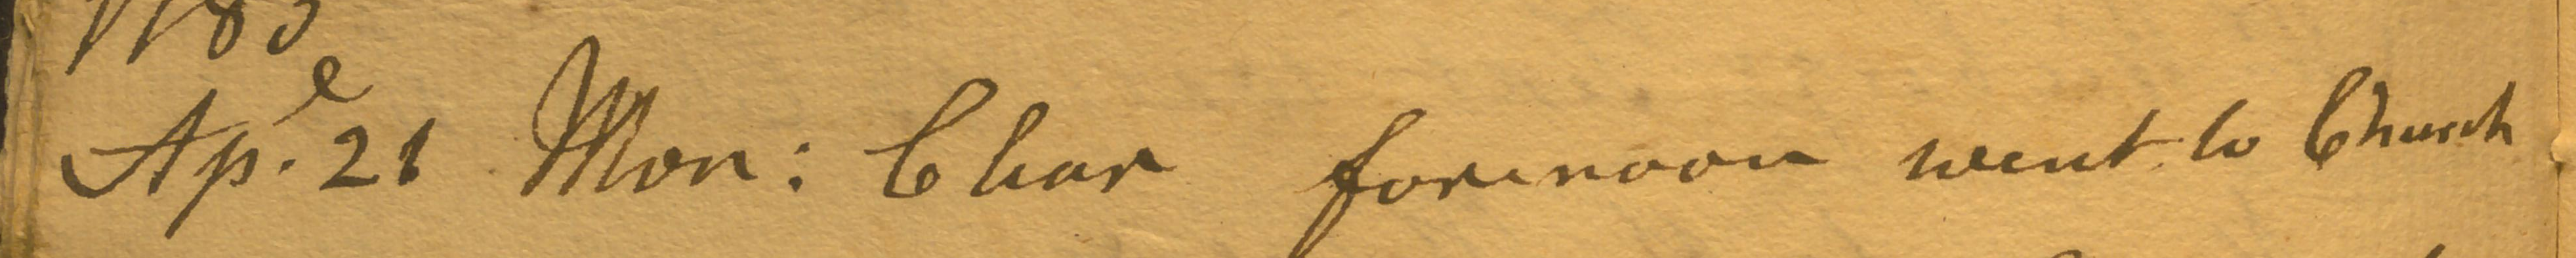Ap^l. 21 Mon: Clear forenoon went to Church
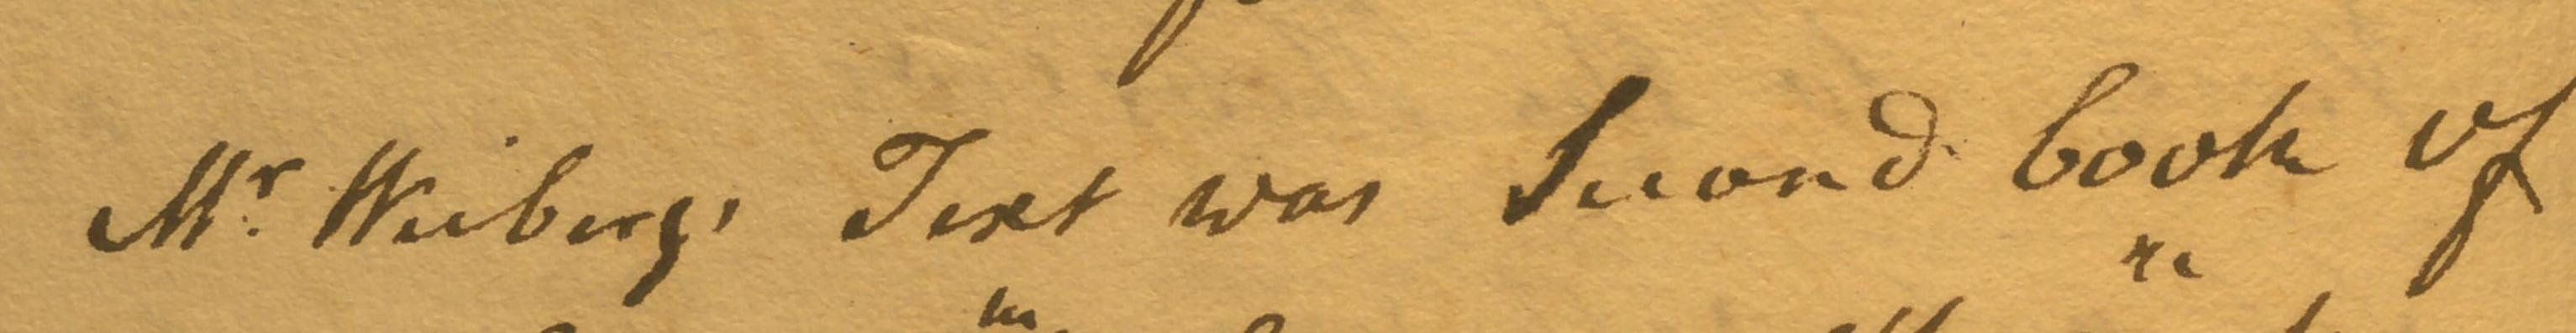M^r. Weibergs Text was second book of
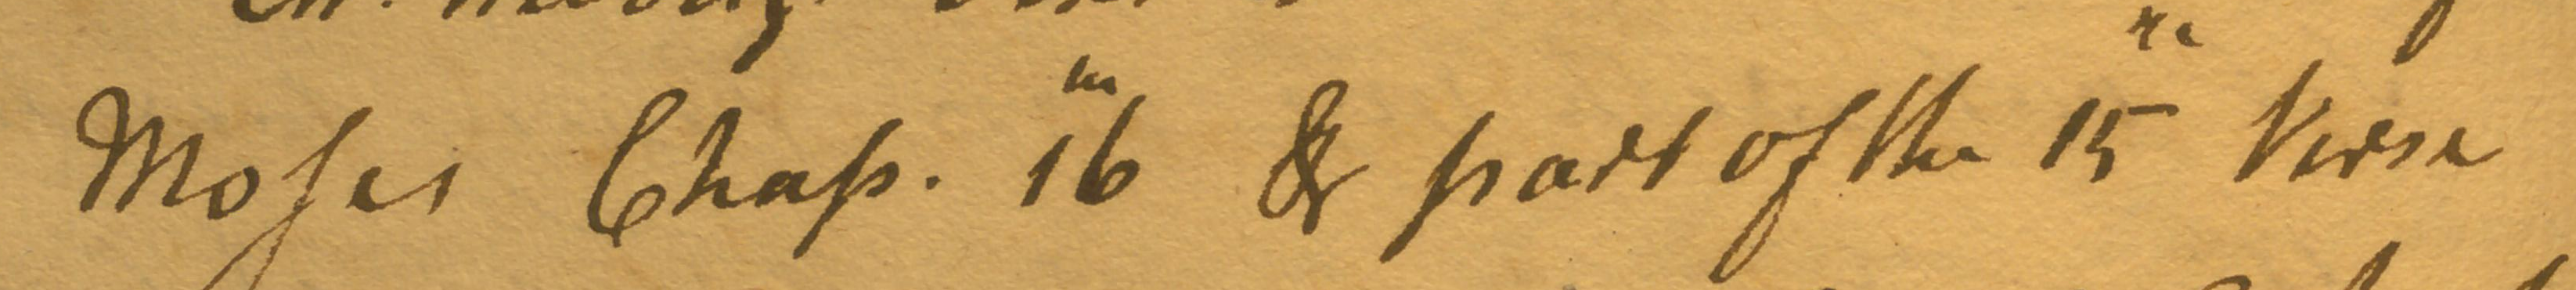Moses Chap. 16^th & part of the 15^th Verse
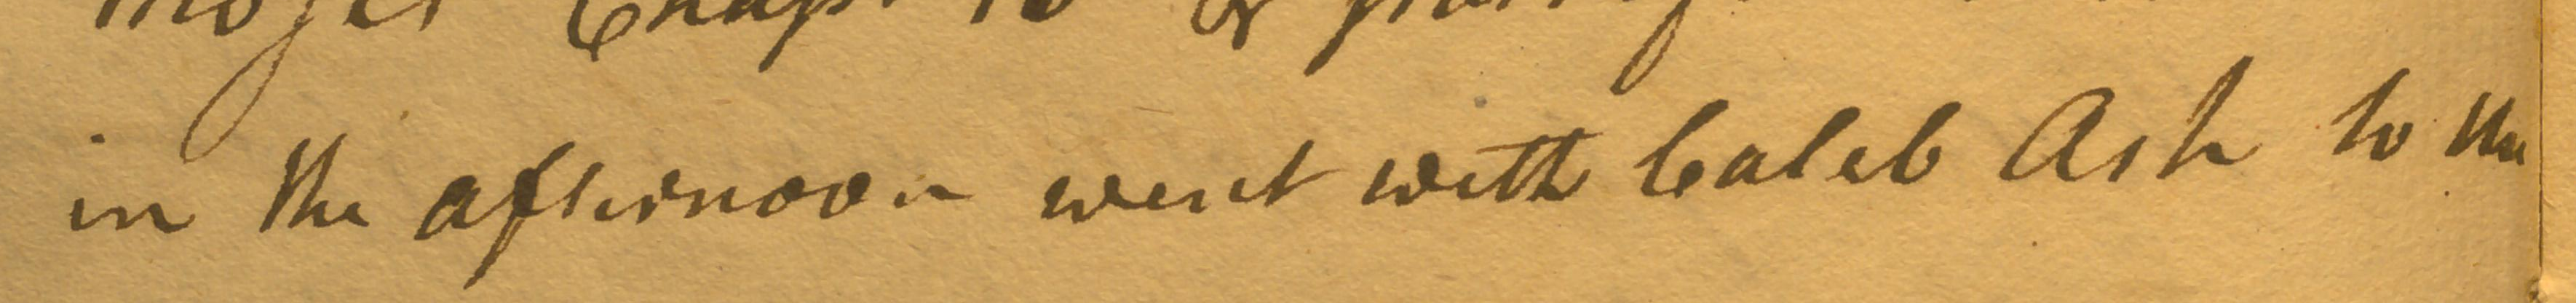in the afternoon went with Caleb Ash to the
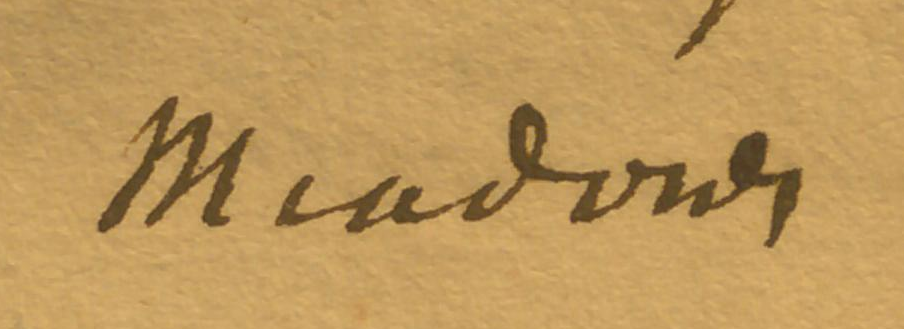Meadows
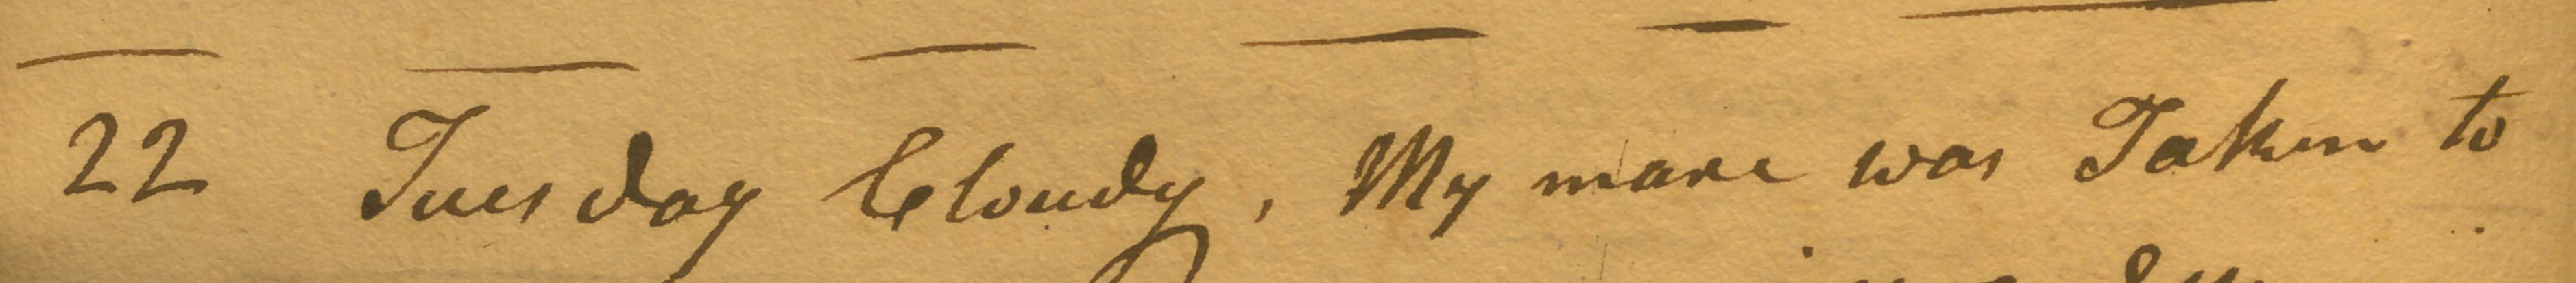22 Tuesday Cloudy, My mare was Taken to
